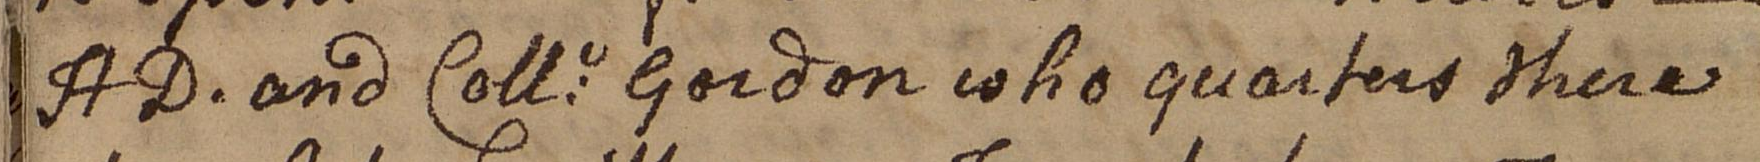HD- and Coll^l: Gordon who quarters there
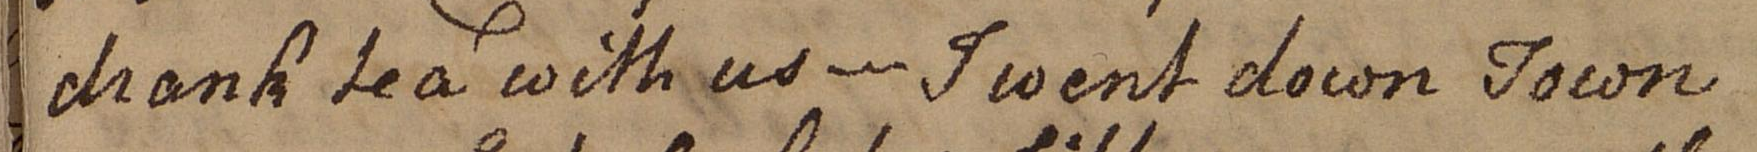drank tea with us- I went down Town
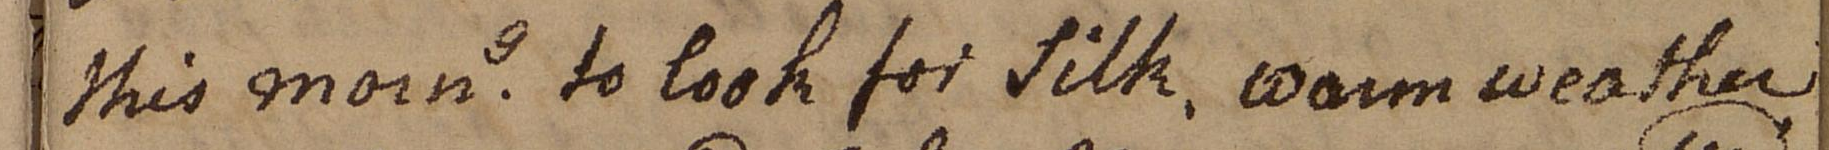this morn^g. to look for Silk, warm weather
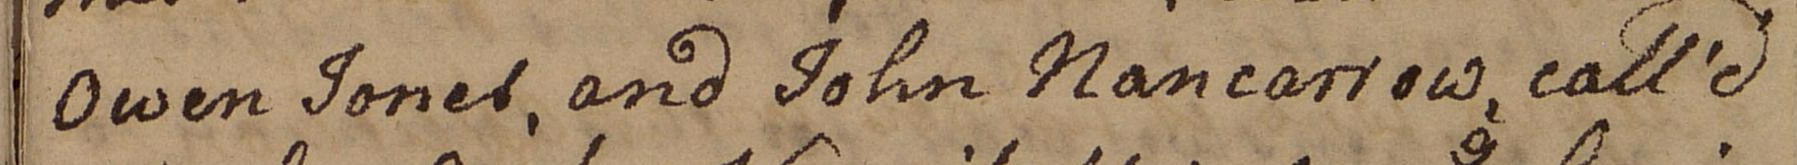Owen Jones, and John Nancarrow, call'd
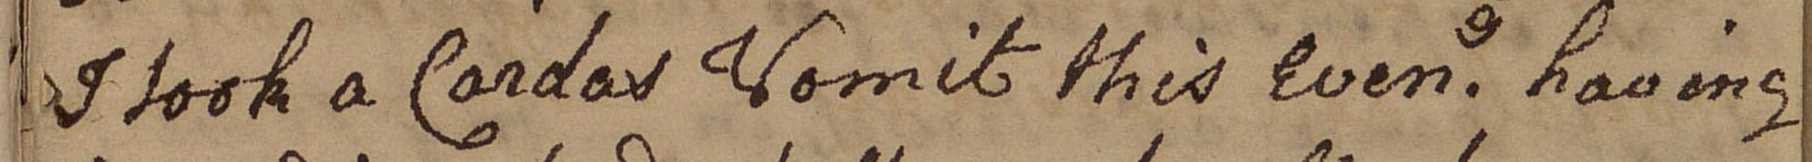I took a Cardas Vomit this Even^g. having
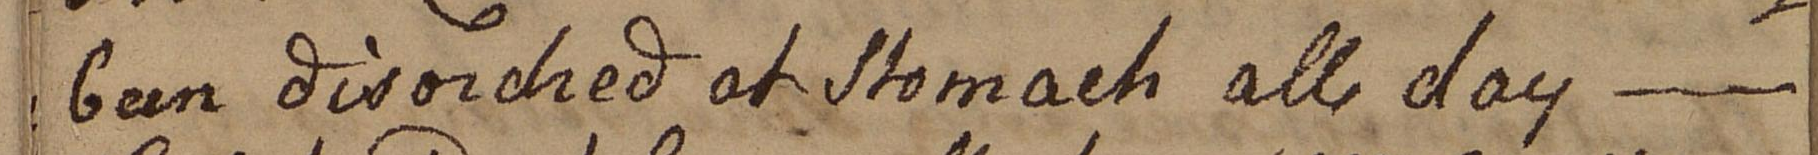been disordred at Stomach all day-
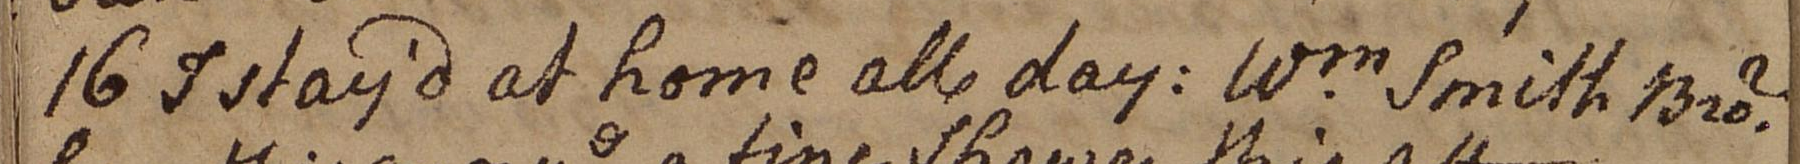16 I stay'd at home all day: W^m. Smith Bro^r.
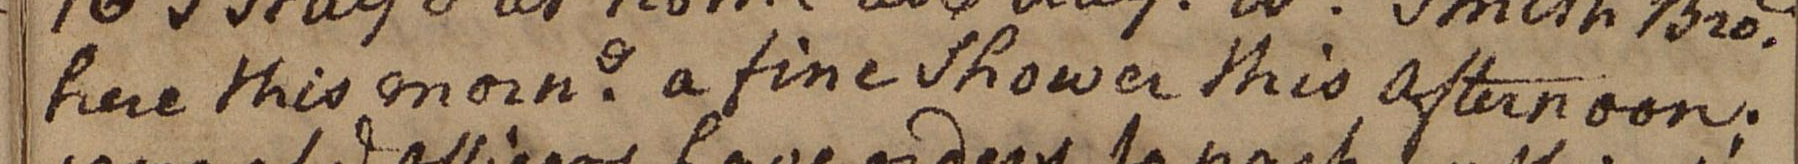here this morn^g. a fine Shower this afternoon;
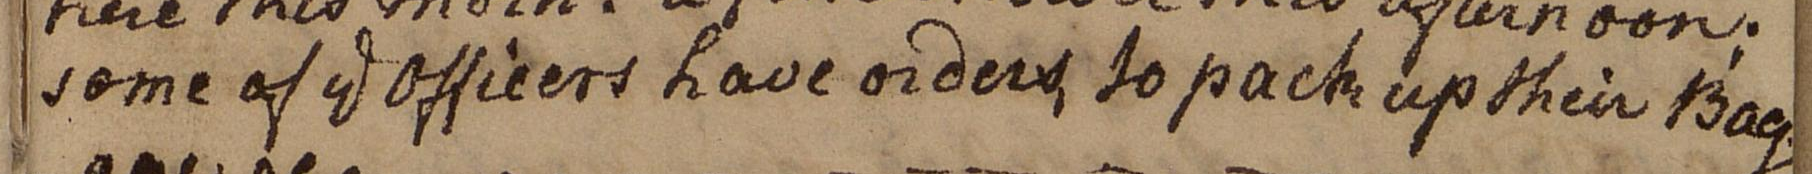some of y^e officers have orders, to pack up their Bag
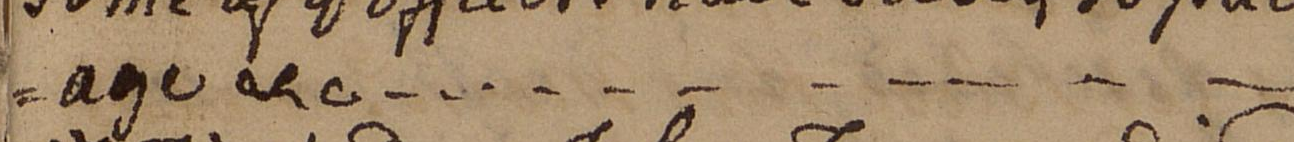-age &c -----------
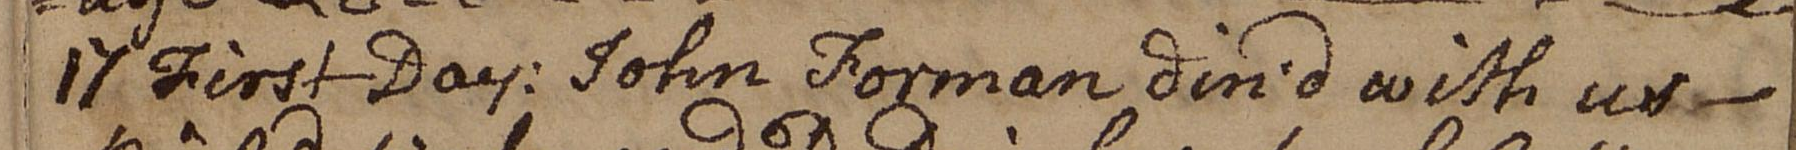17 First Day: John Forman din'd with us-
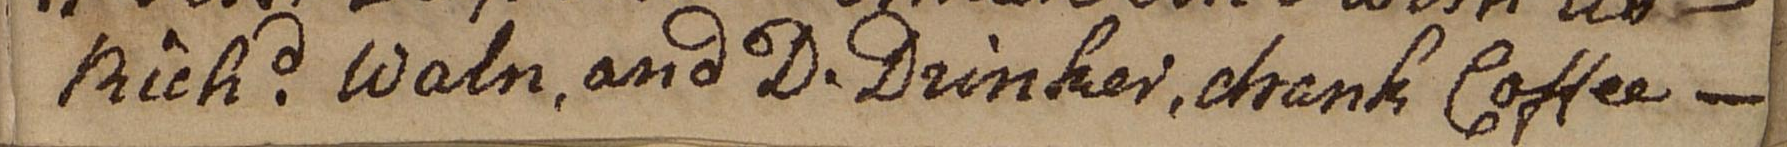Rich^d. Waln, and D. Drinker, drank Coffee-
